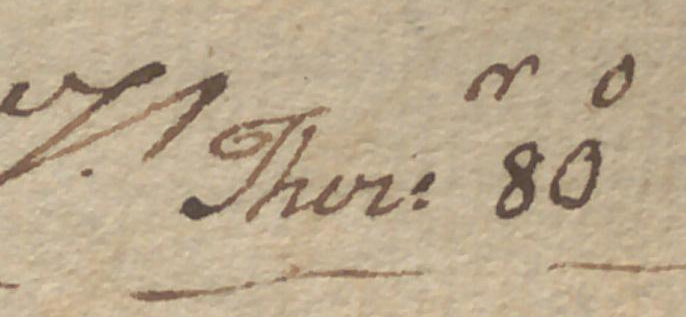Ther^r: 80°
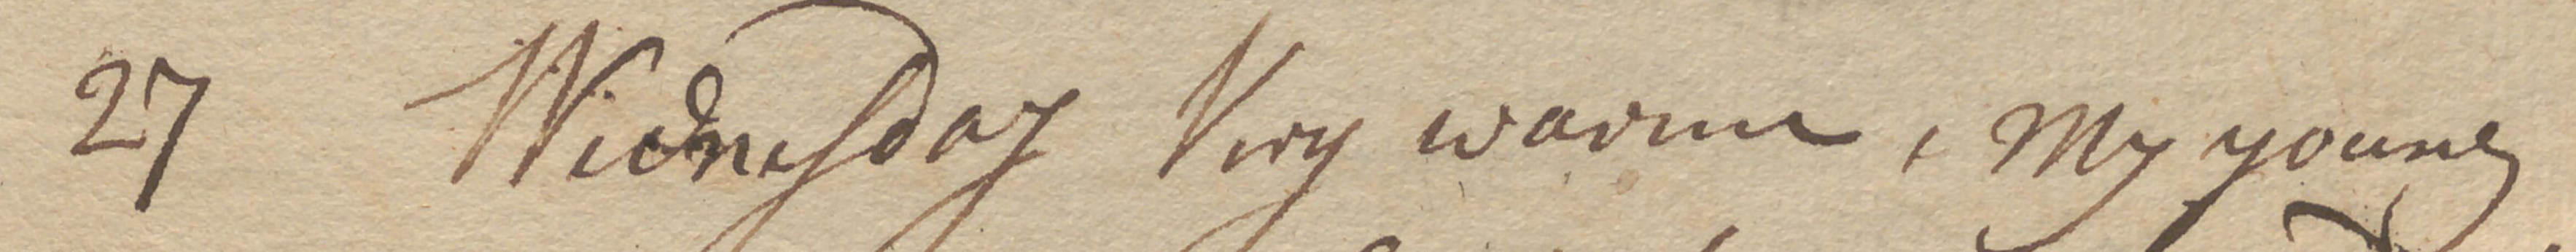27 Wednesday Very warme, My young
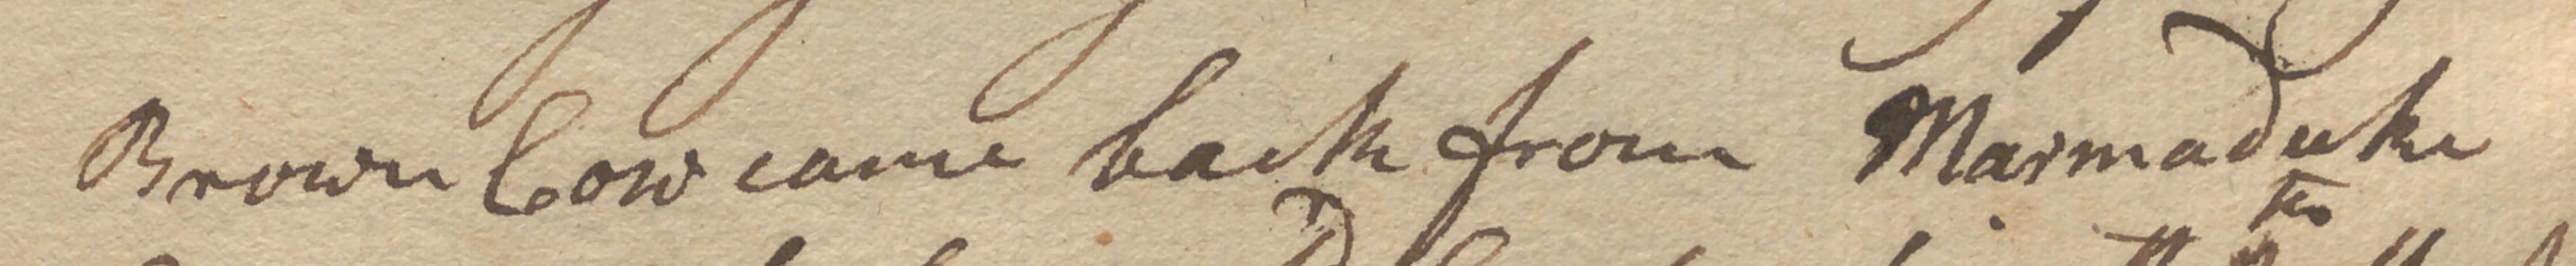Brown Cow came back from Marmaduke
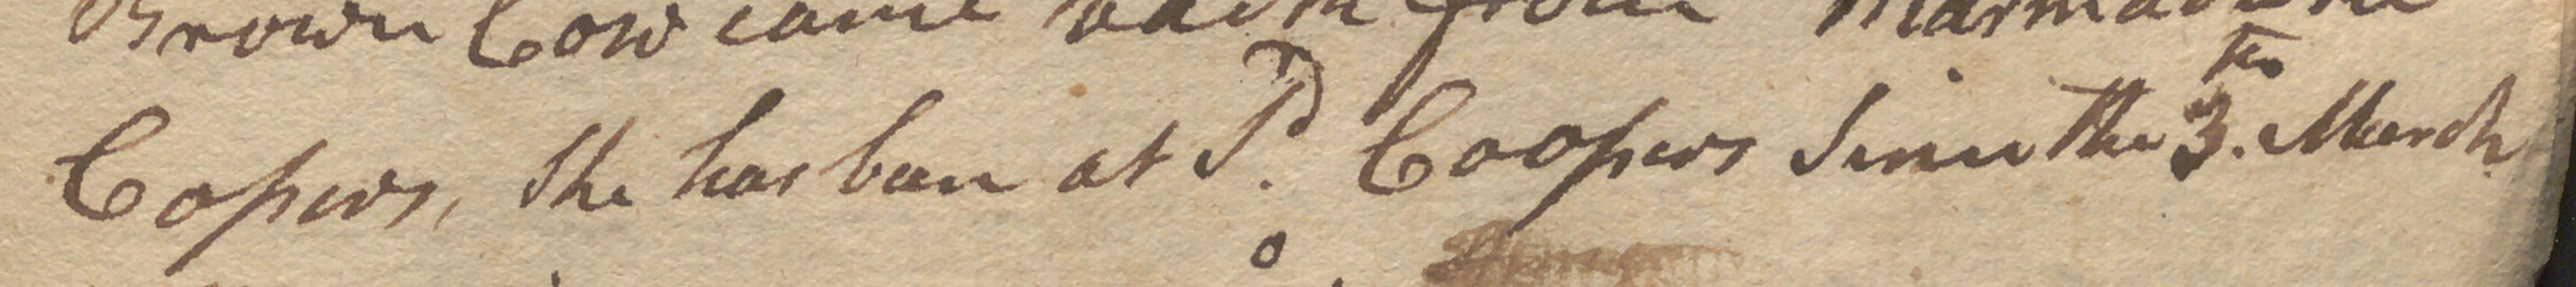Copers, she has been at s^d. Coopers Since the 3^th. March
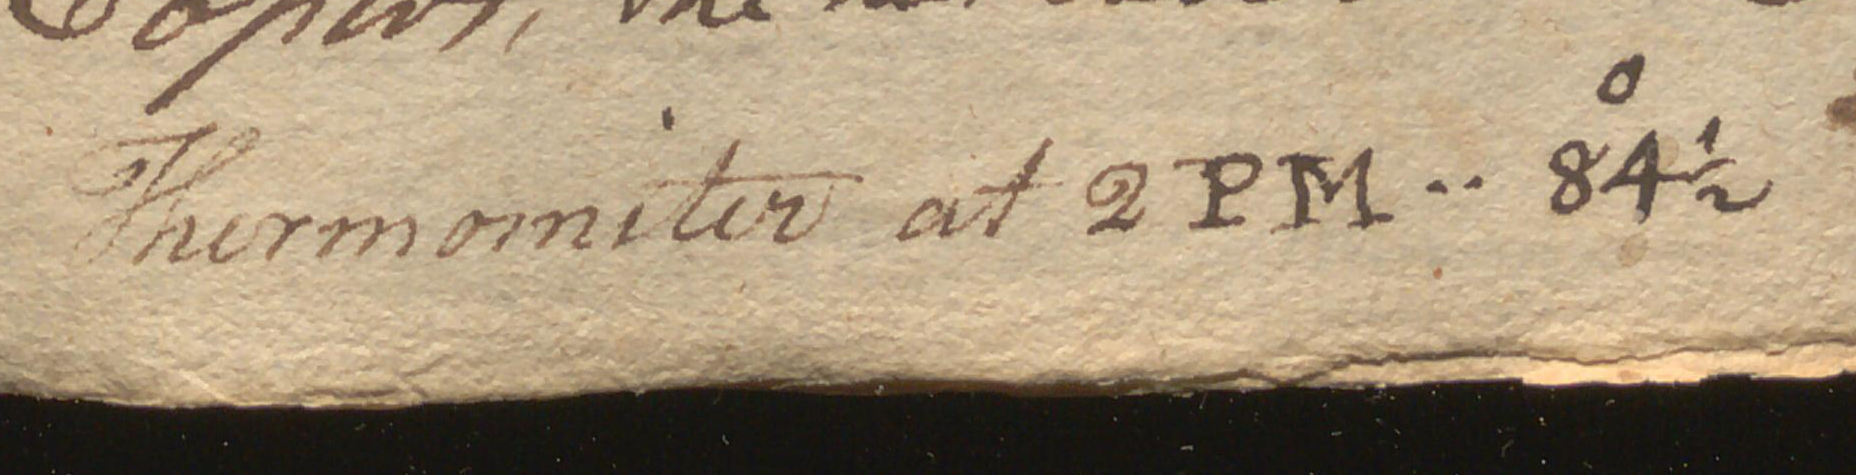Thermomiter at 2 PM.. 84 1/2°
